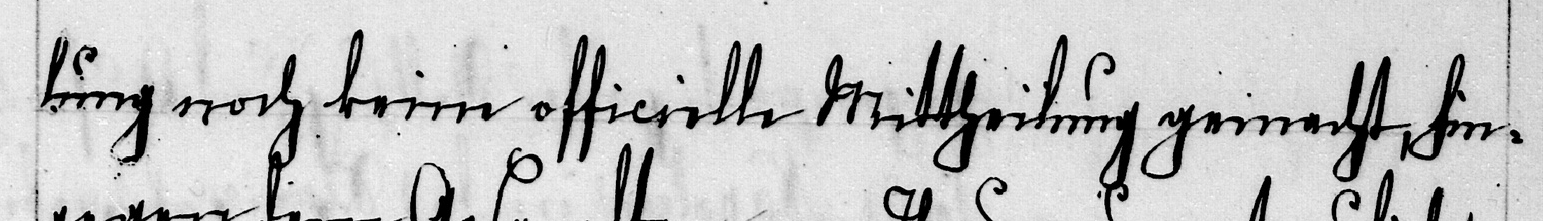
mlung noch keine officielle Mittheilung gemacht, hin¬
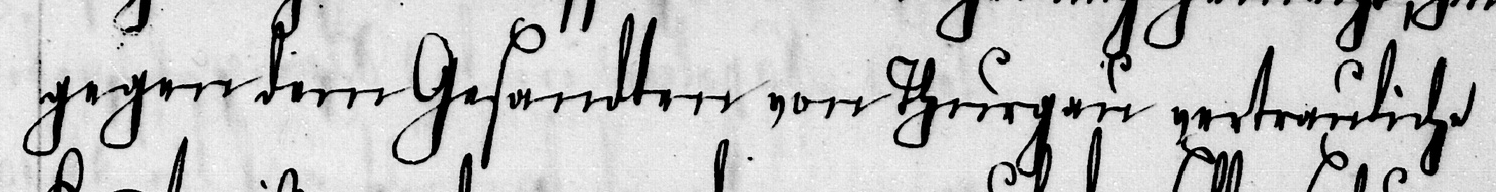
gegen dem Gesandten von Thurgau vertrauliche
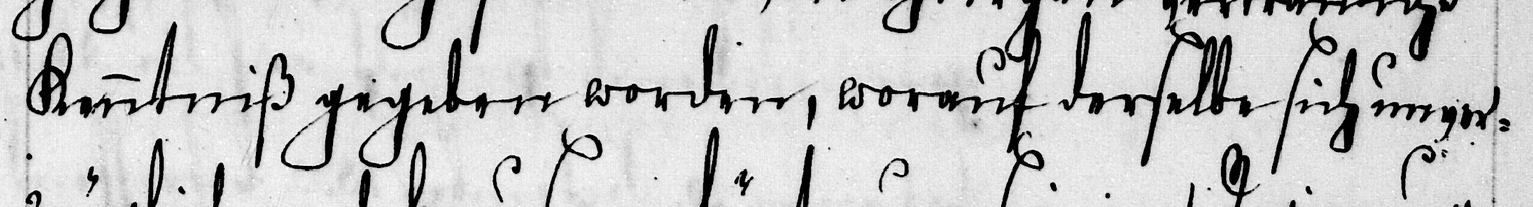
Kenntniß gegeben worden, worauf derselbe sich unver¬
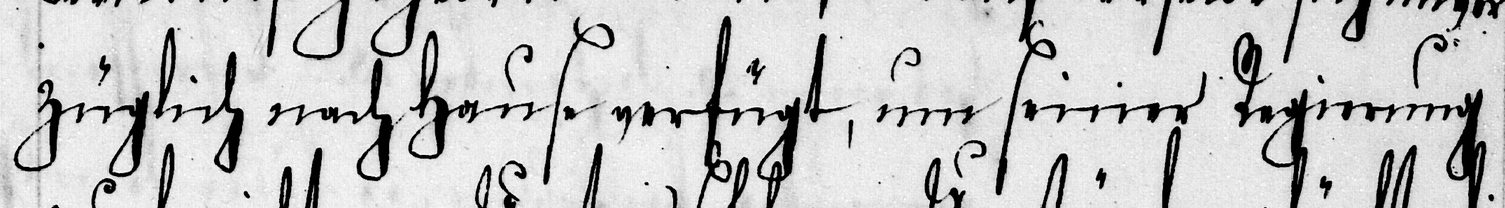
züglich nach Hause verfügt, um seiner Regierung
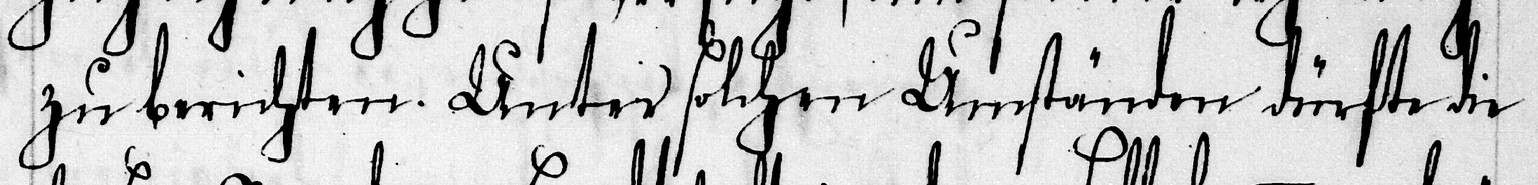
zu berichten. Unter solchen Umständen dürfte die
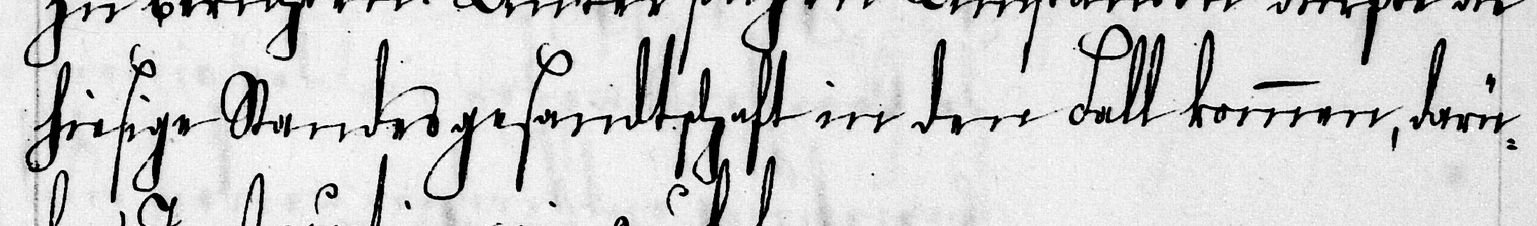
hiesige Standesgesandtschaft in den Fall kommen, da¬
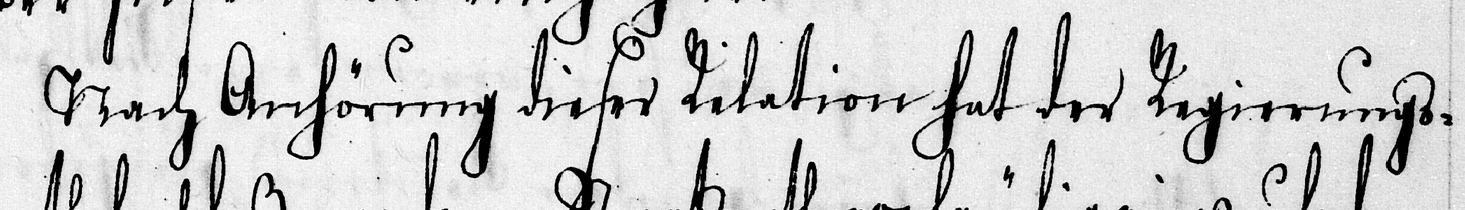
Nach Anhörung dieser Relation hat der Regierungs¬
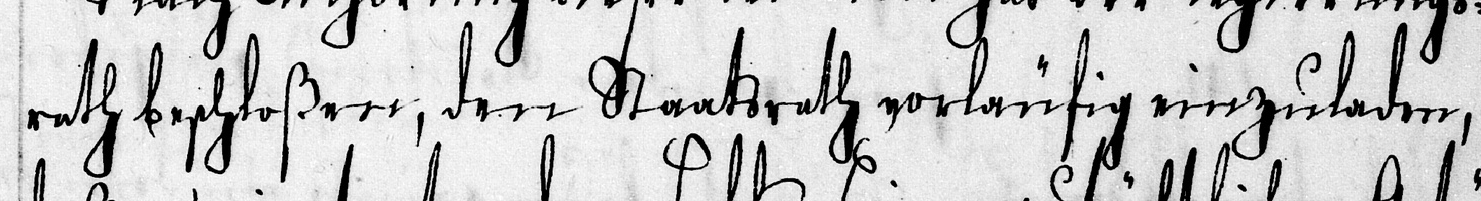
rath beschloßen, den Staatsrath vorläufig einzuladen,
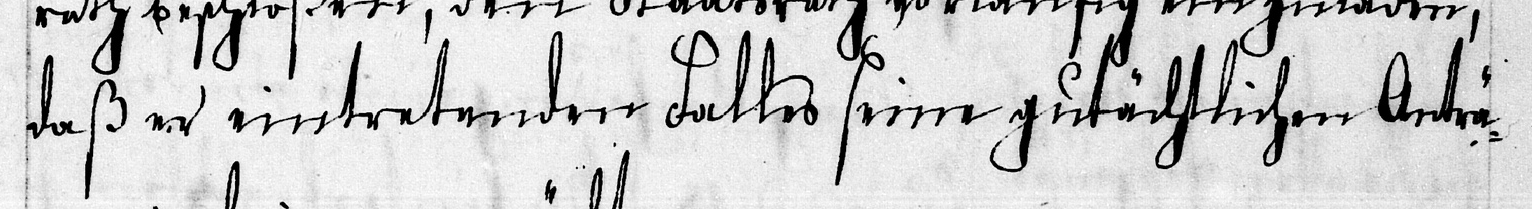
daß er eintretenden Falles seine gutächtlichen Anträ¬
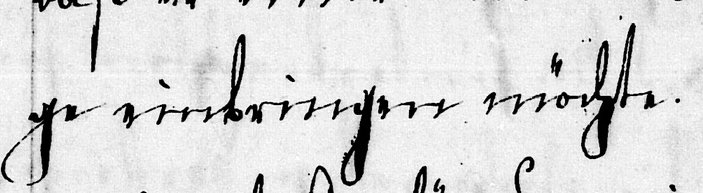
ge einbringen möchte.
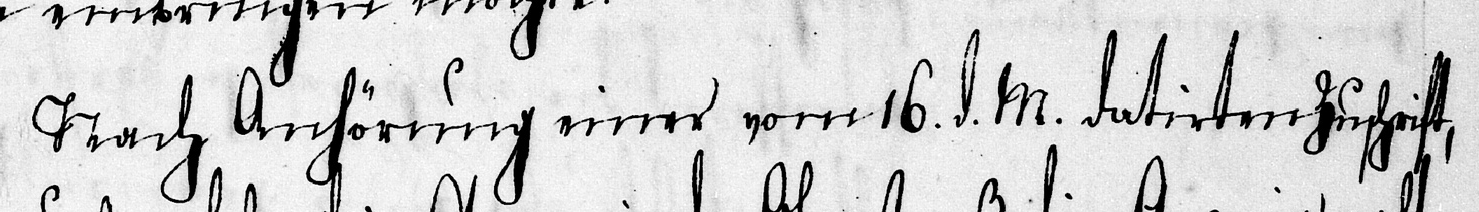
Nach Anhörung einer vom 16. d. M. datirten Zuschrift
